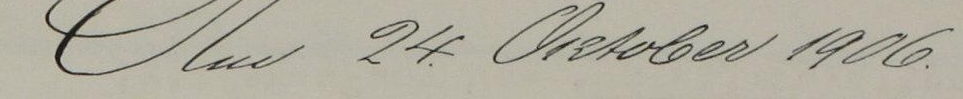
Am 24. Oktober 1906.
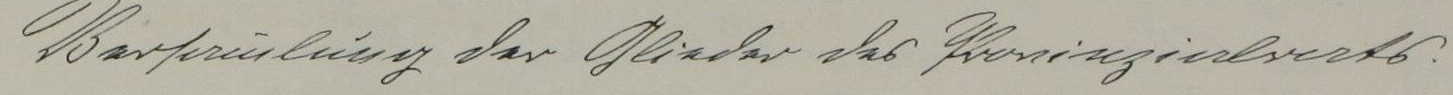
Versammlung der Glieder des Provinzialrats.
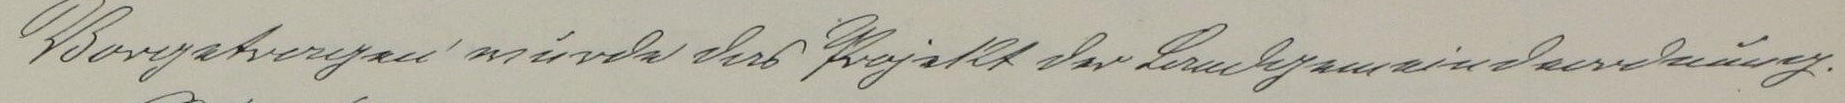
Vorgetragen wurde das Projekt der Landgemeindeordnung.
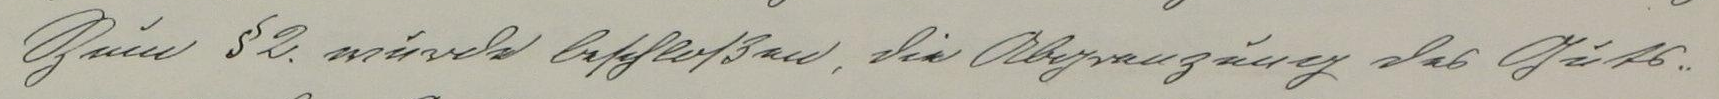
Zum §2. wurde beschloßen, die Abgrenzung des Guts-
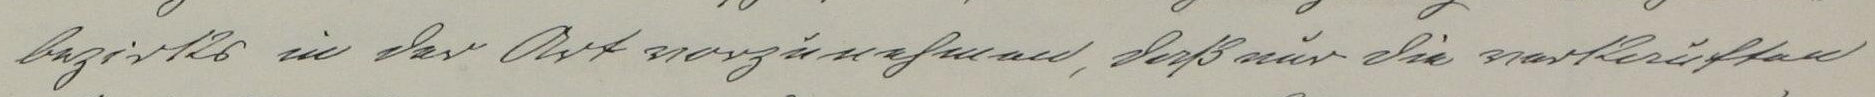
bezirks in der Art vorzunehmen, daß nur die verkauften
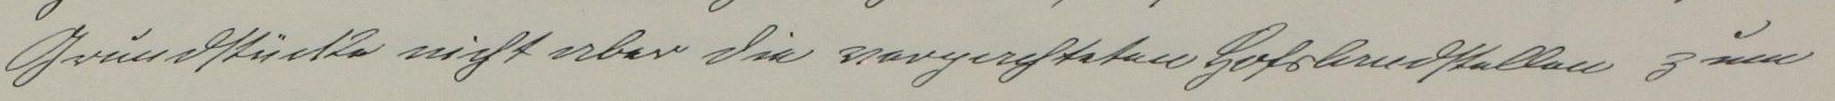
Grundstücke, nicht aber die verpachteten Hofslandstellen zum
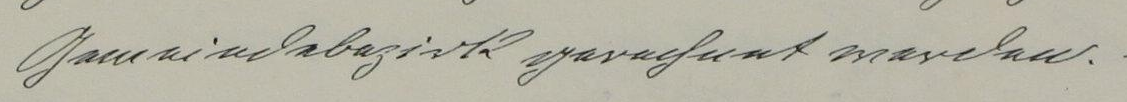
Gemeindebezirk gerechnet werden.
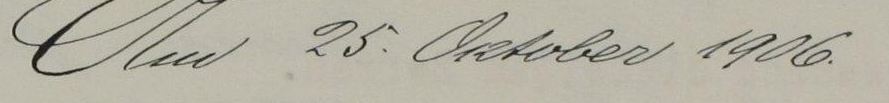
Am 25. Oktober 1906.
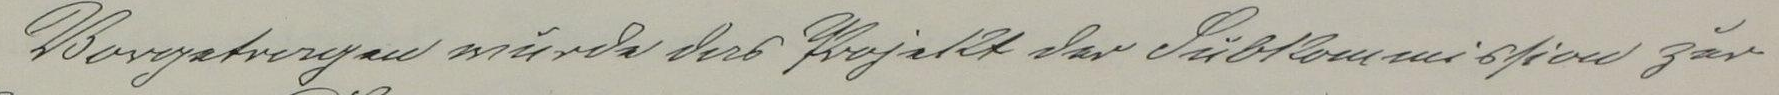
Vorgetragen wurde das Projekt der Subkommission zur
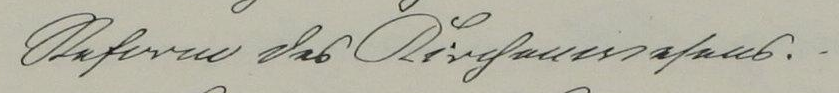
Reform des Kirchenwesens.
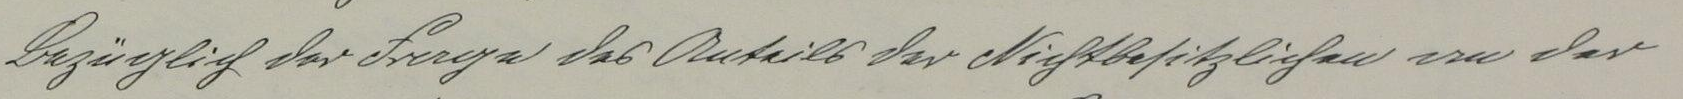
Bezüglich der Frage des Anteils der Nichtbesitzlichen an der
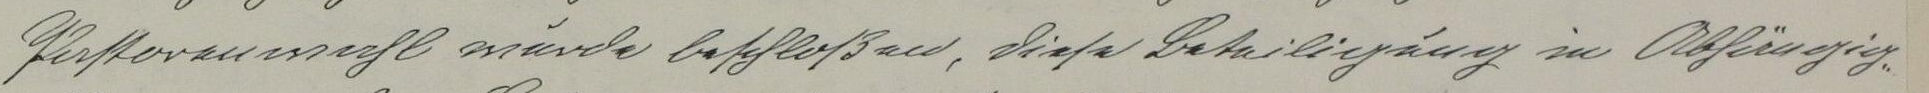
Pastorenwahl wurde beschloßen, diese Beteiligung in Abhängig-
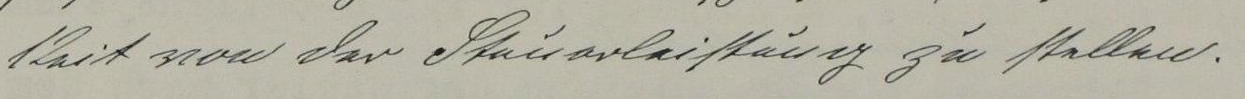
keit von der Steuerleistung zu stellen.
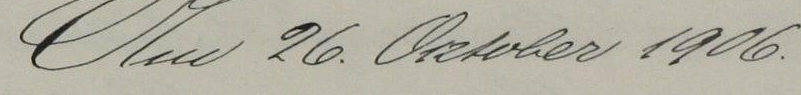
Am 26. Oktober 1906.
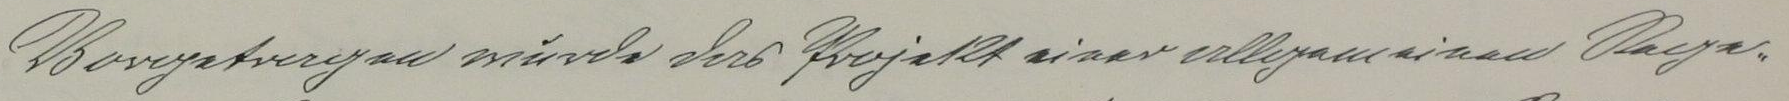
Vorgetragen wurde das Projekt einer allgemeinen Rege-
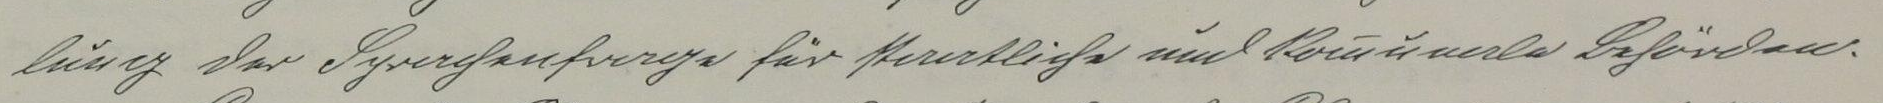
lung der Sprachenfrage für staatliche und kommunale Behörden.
